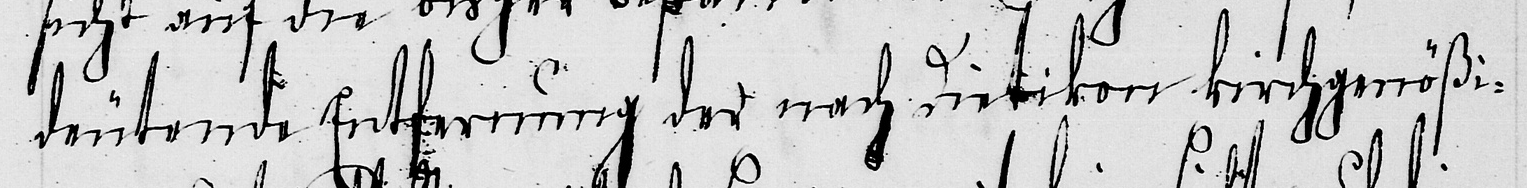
deutende Entfernung der nach Dietikon kirchgenößi¬
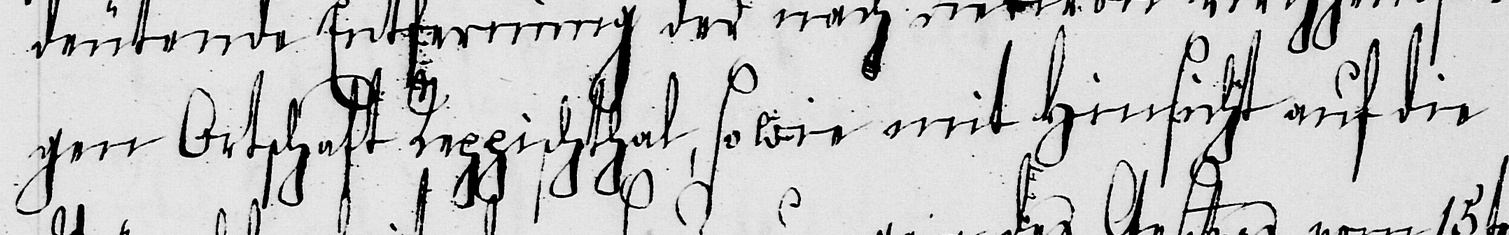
gen Ortschaft Reppischthal, sowie mit Hinsicht auf die
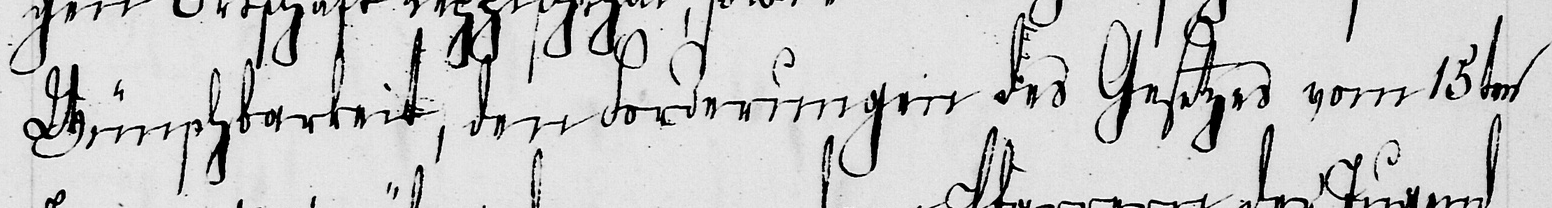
Wünschbarkeit, den Forderungen des Gesetzes vom 15ten
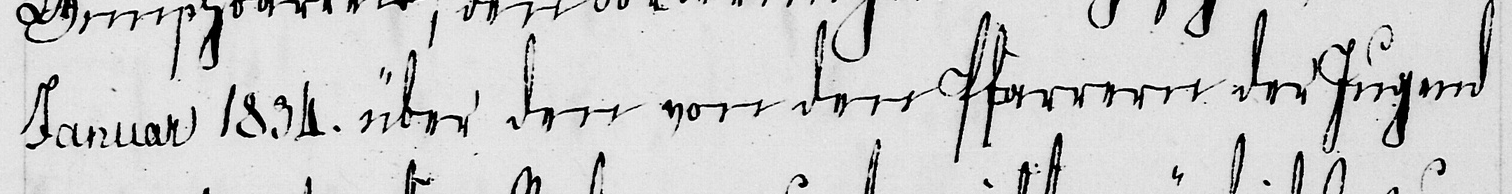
Januar 1834. über den von den Pfarrern der Jugend
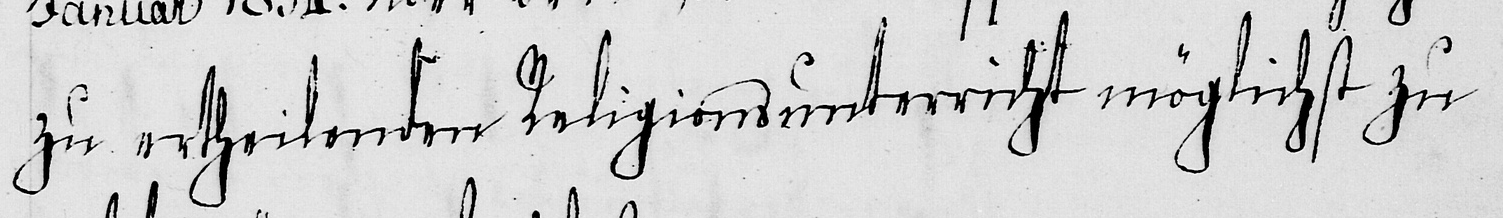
zu ertheilenden Religionsunterricht möglichst zu
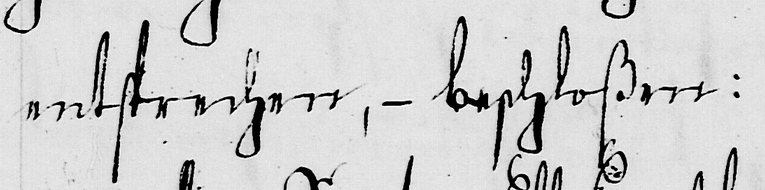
entsprechen, – beschloßen:
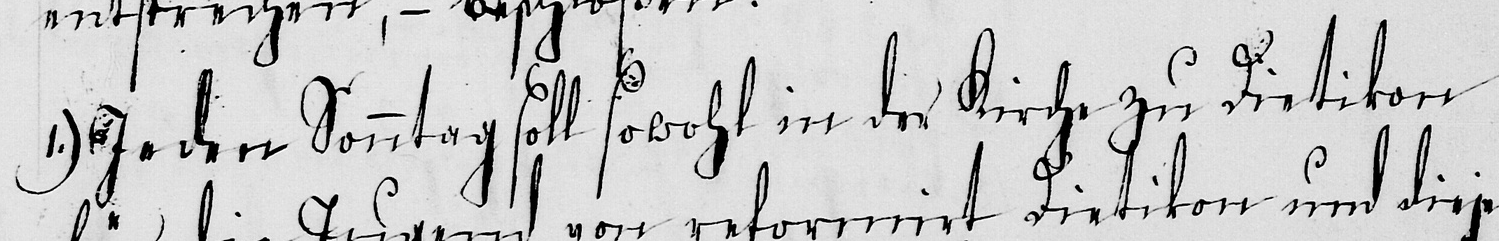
1.) Jeden Sonntag sowohl in der Kirche zu Dietikon
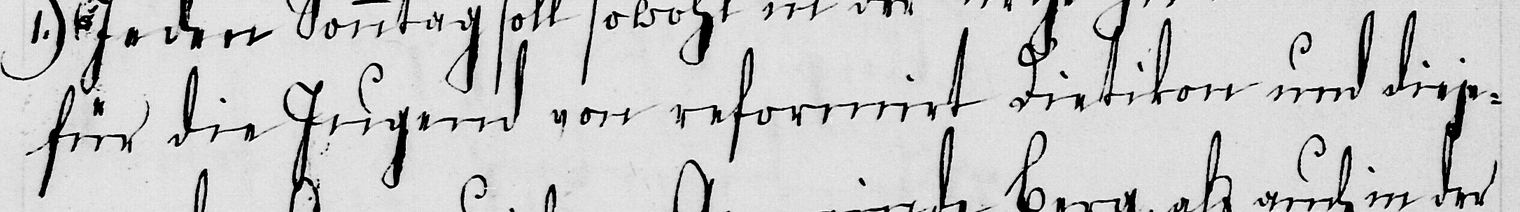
für die Jugend von reformirt Dietikon und dieje¬
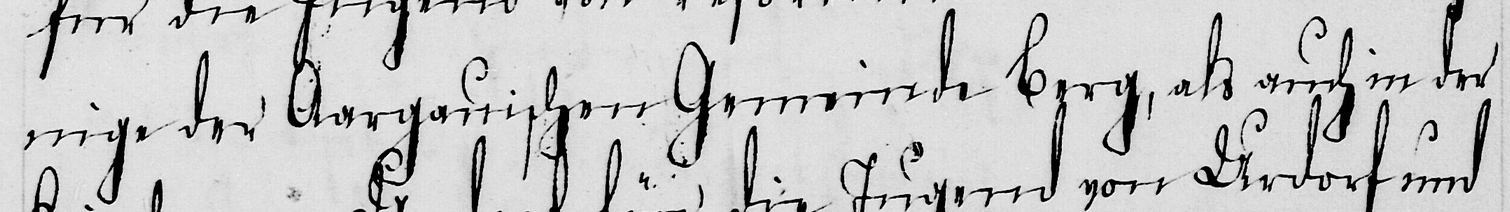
nige der Aargauischen Gemeinde Berg, als auch in der
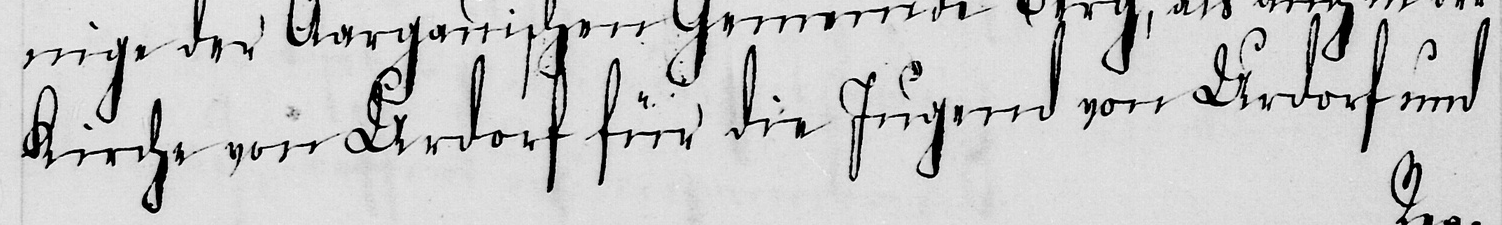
Kirche von Urdorf für die Jugend von Urdorf und
